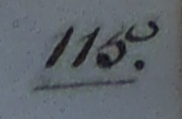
115.
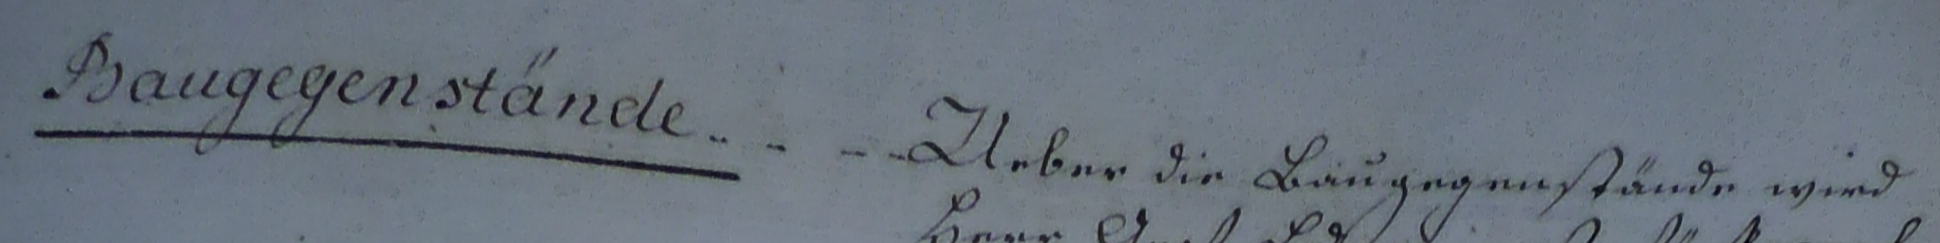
Baugegenstände .. .. .. Ueber die Baugegenstände wird
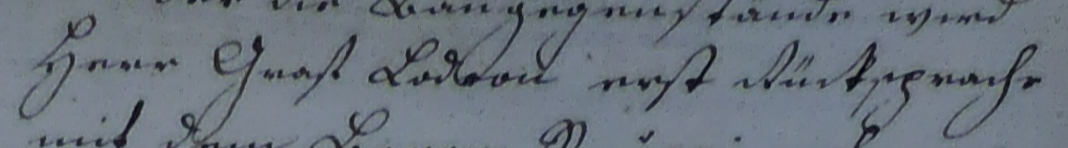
Herr Graf Lodron erst Rücktsprache
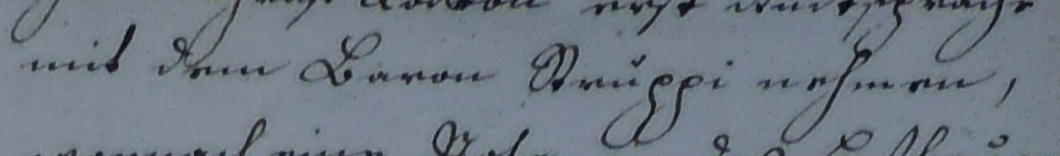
mit dem Baron Struppi nehmen,
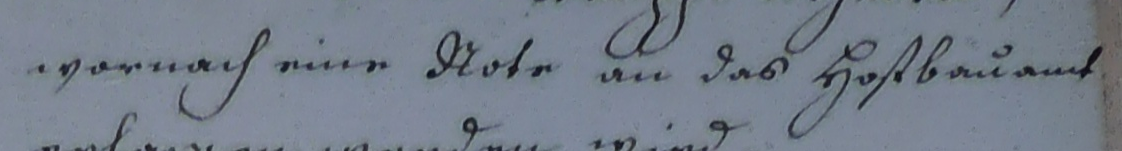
wornach eine Note an das Hofbauamnt
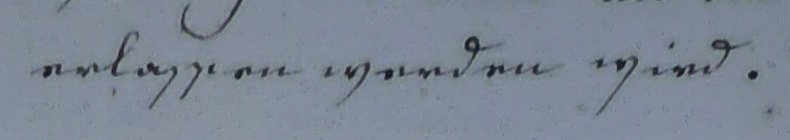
erlassen werden wird.
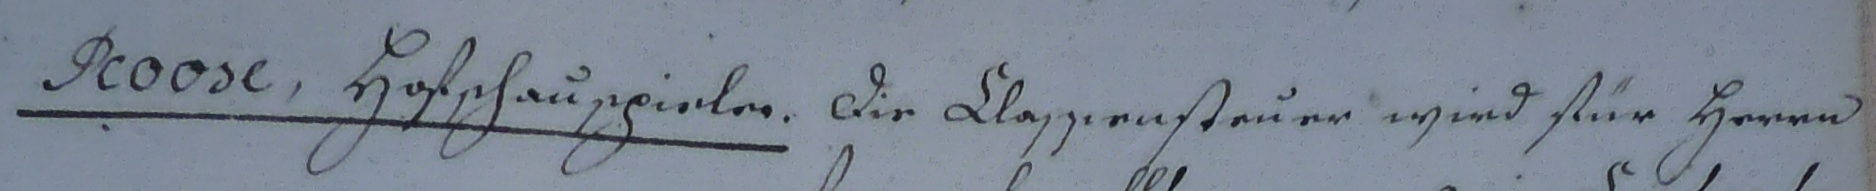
Roose, Hofschauspieler. Die Classensteuer wird für Herrn
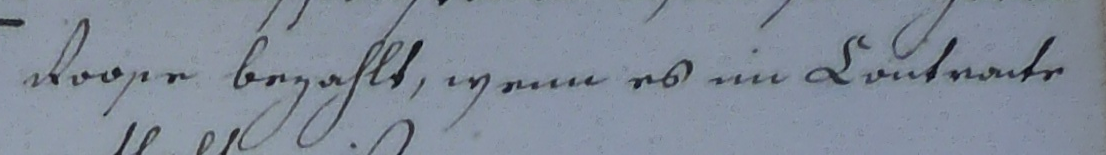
Roose bezahlt, wenn es in Contracte
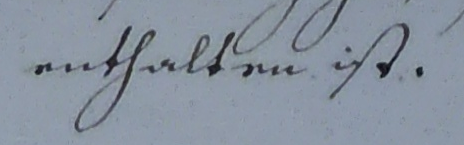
enthalten ist.
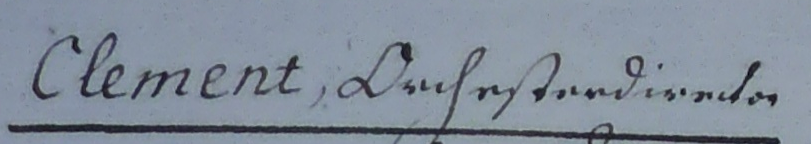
Clement, Orchesterdirector
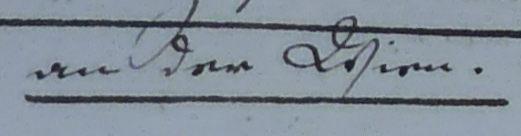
an der Wien.
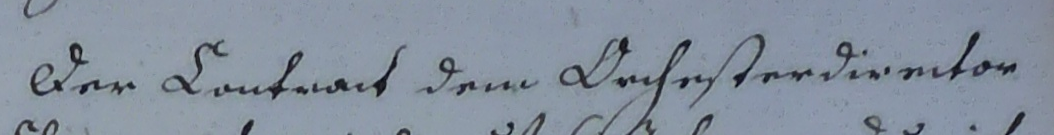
Der Contract dem Orchesterdirector
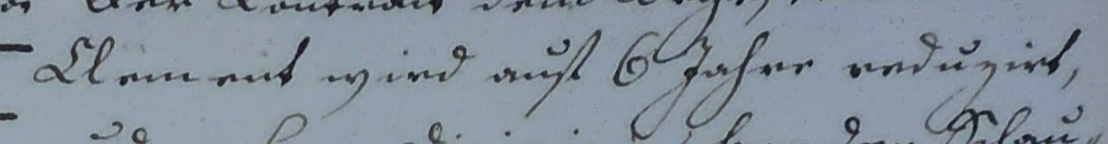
Clement wird auf 6 Jahre reduzirt,
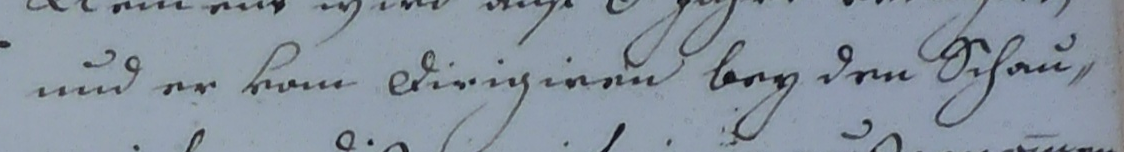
und er vom Dirigiren bey den Schau¬
